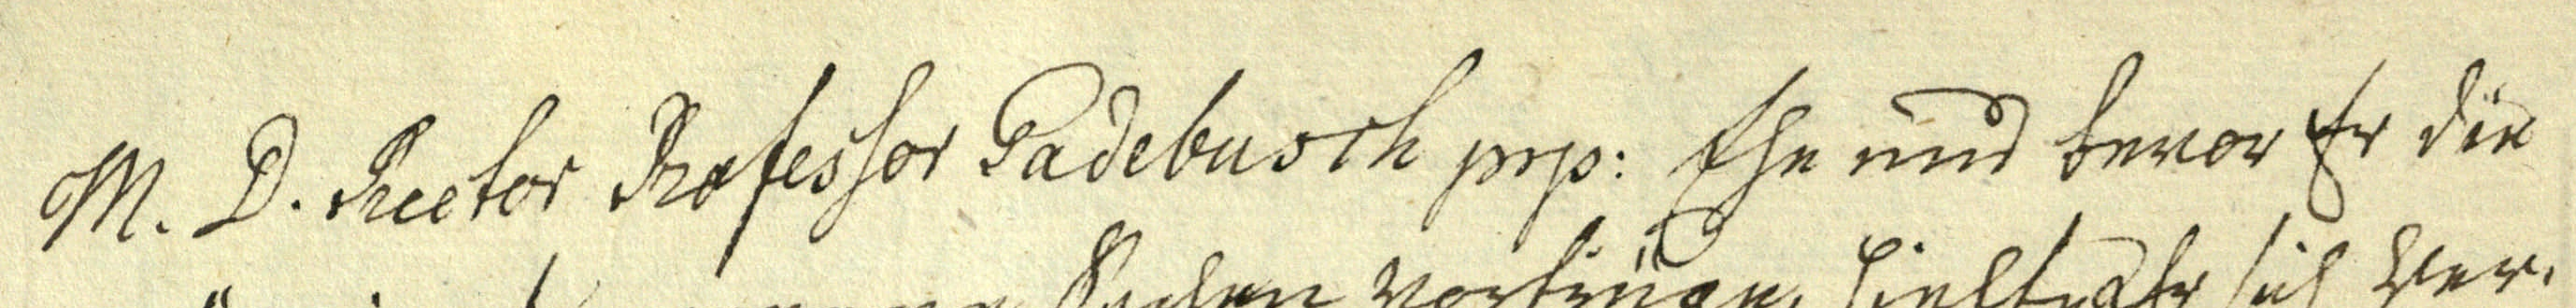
M. D. Rector Professor Gadebusch prp. Ehe und bevor Er die
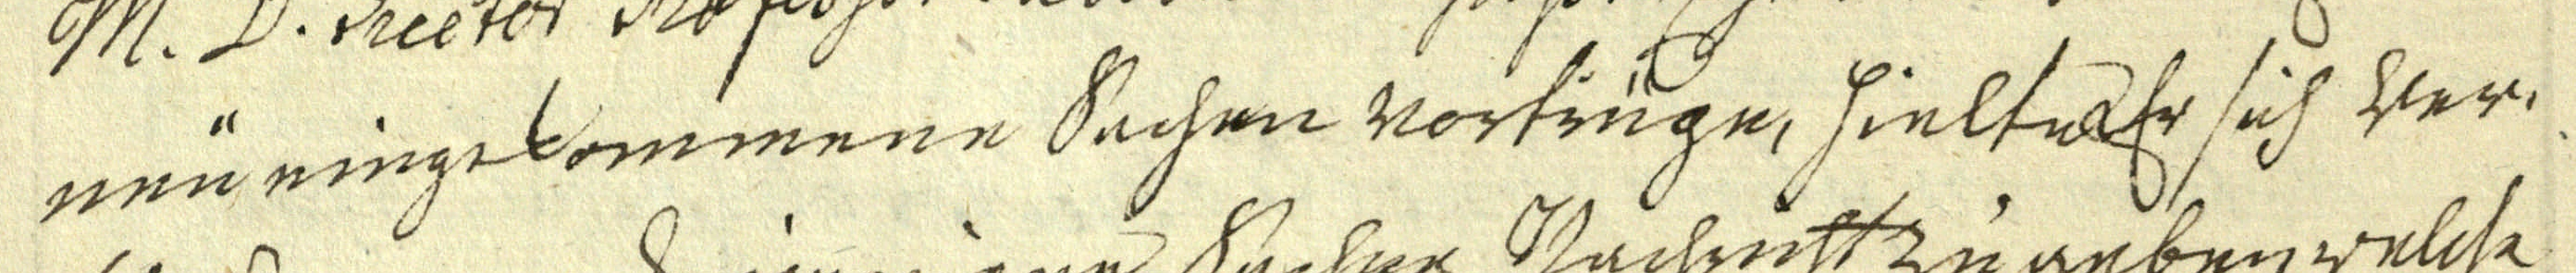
neu eingekommene Sachen vortrüge, hielte Er sich ver¬
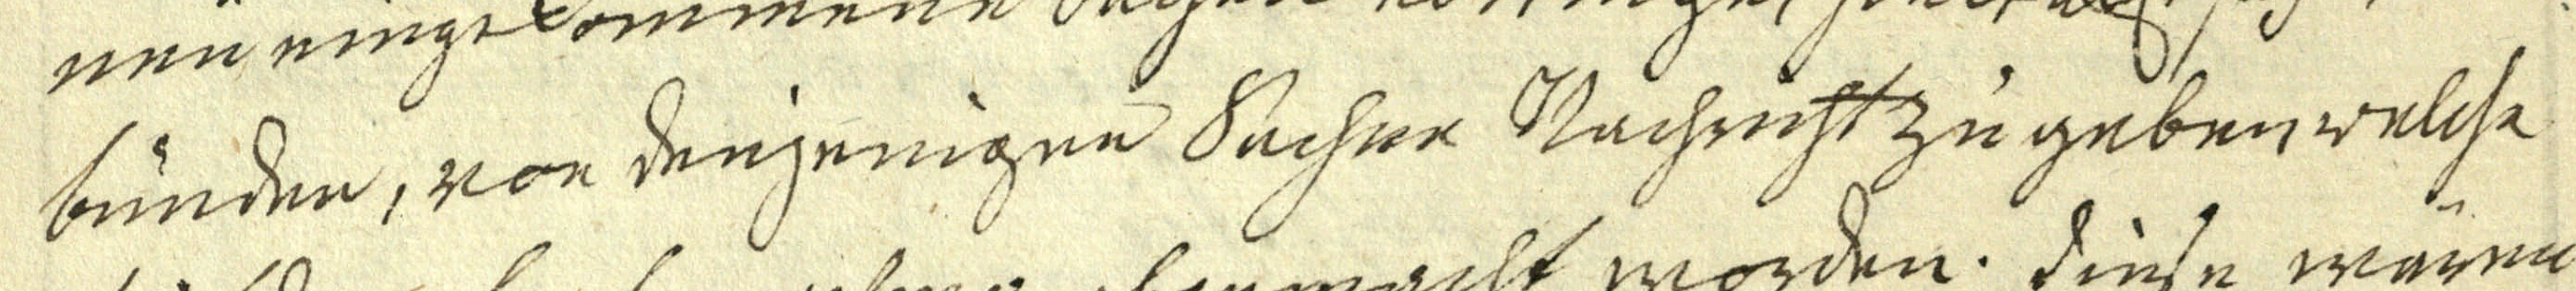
bunden, von denjenigen Sachen Nachricht zu geben, welche
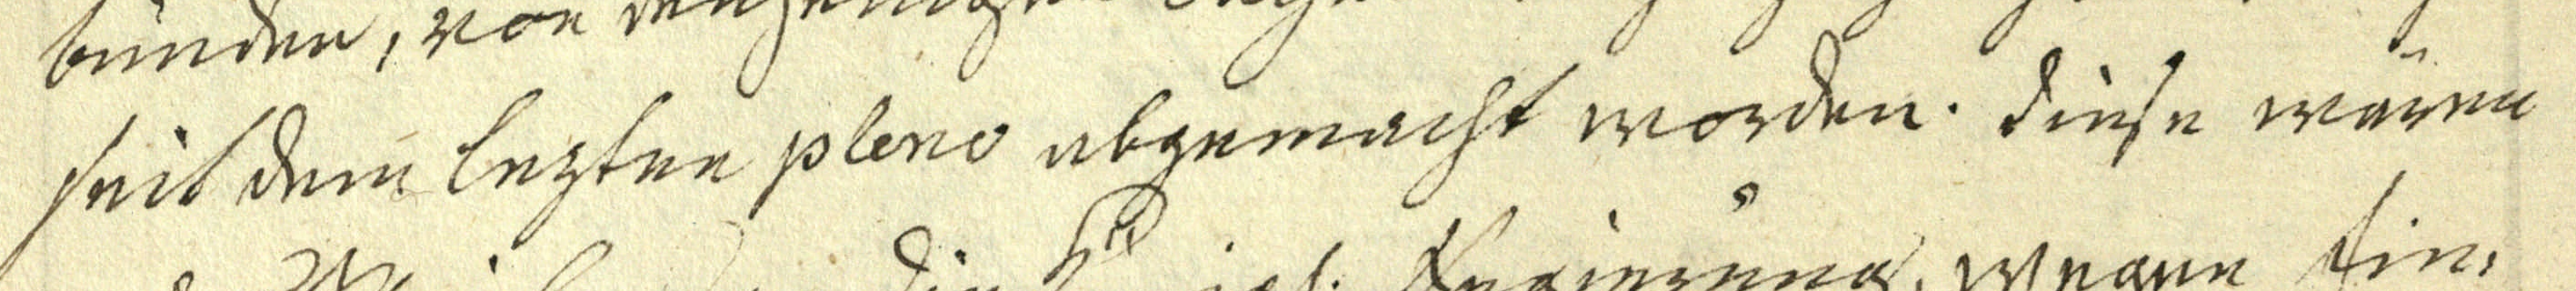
seit dem lezten pleno abgemacht worden. diese wären
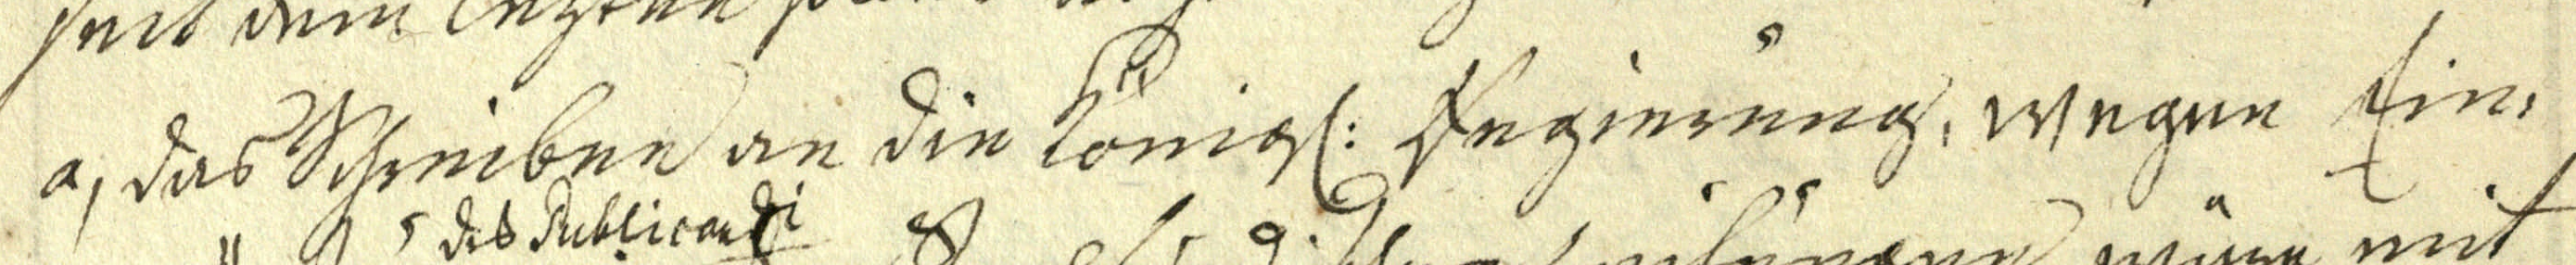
a, das Schreiben an die Königl. Regierung, wegen Ein¬
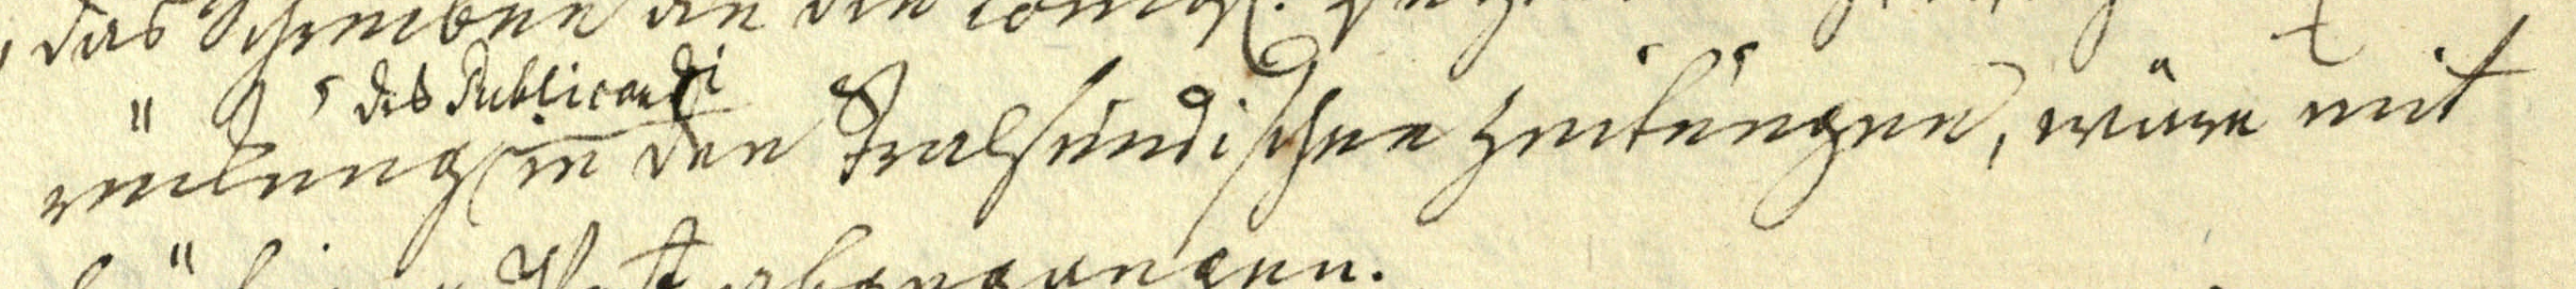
rückung des Publicandi in den Stralsundischen Zeitungen, wäre mit
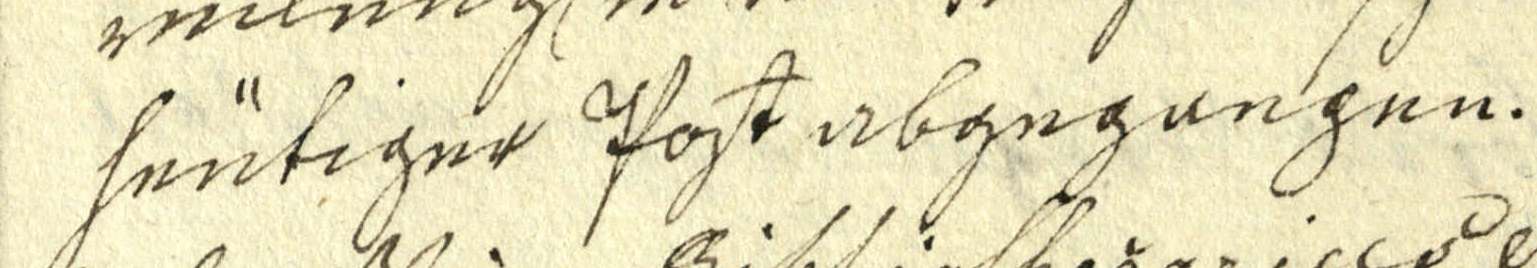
heutiger Post abgegangen
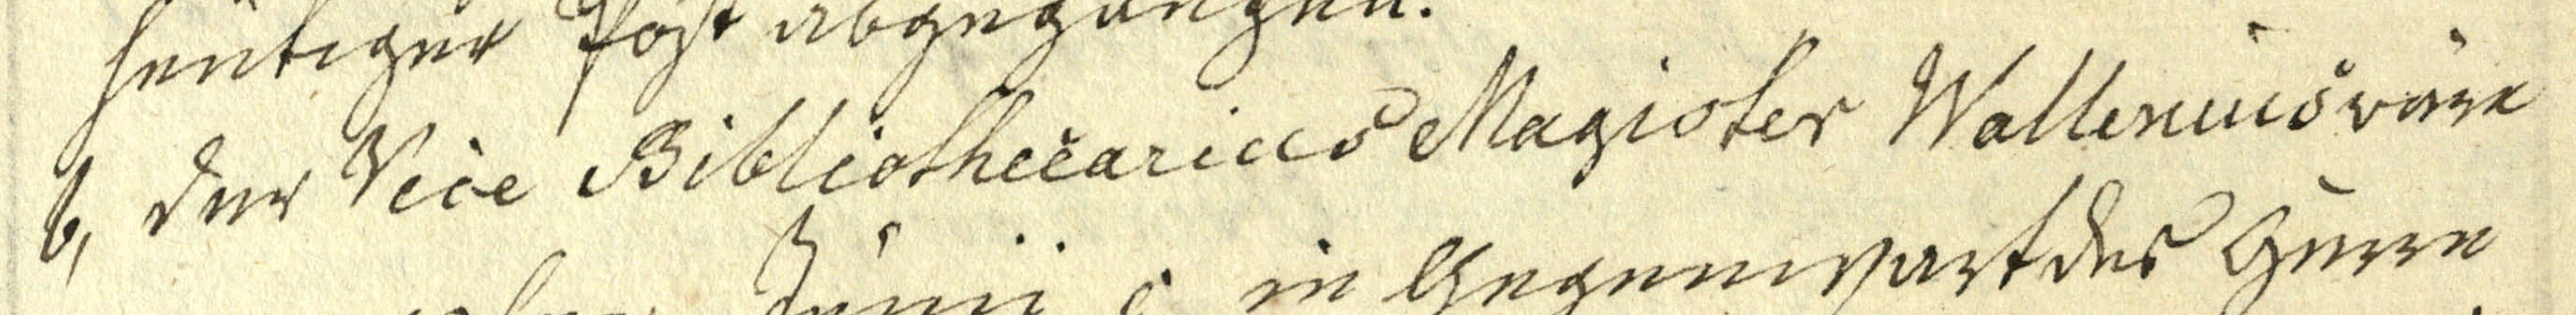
b, der Vice Bibliothecarius Magister Wallenius wäre
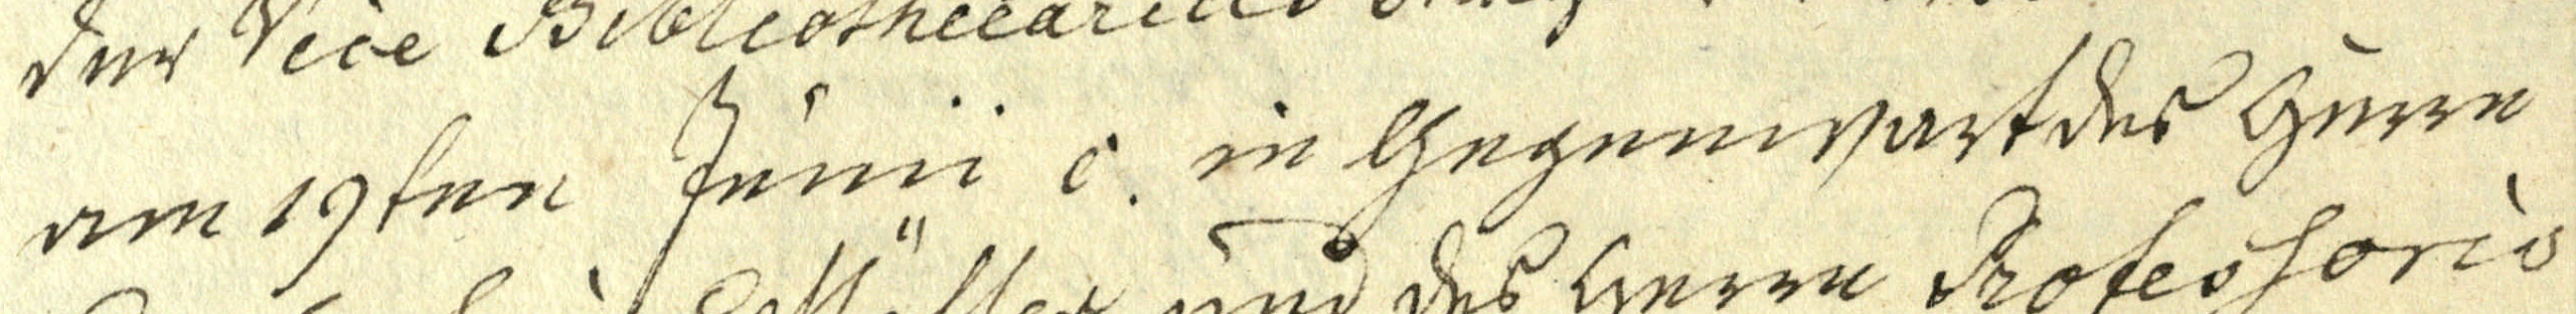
am 19 ten Junii c. in Gegenwart des Herrn
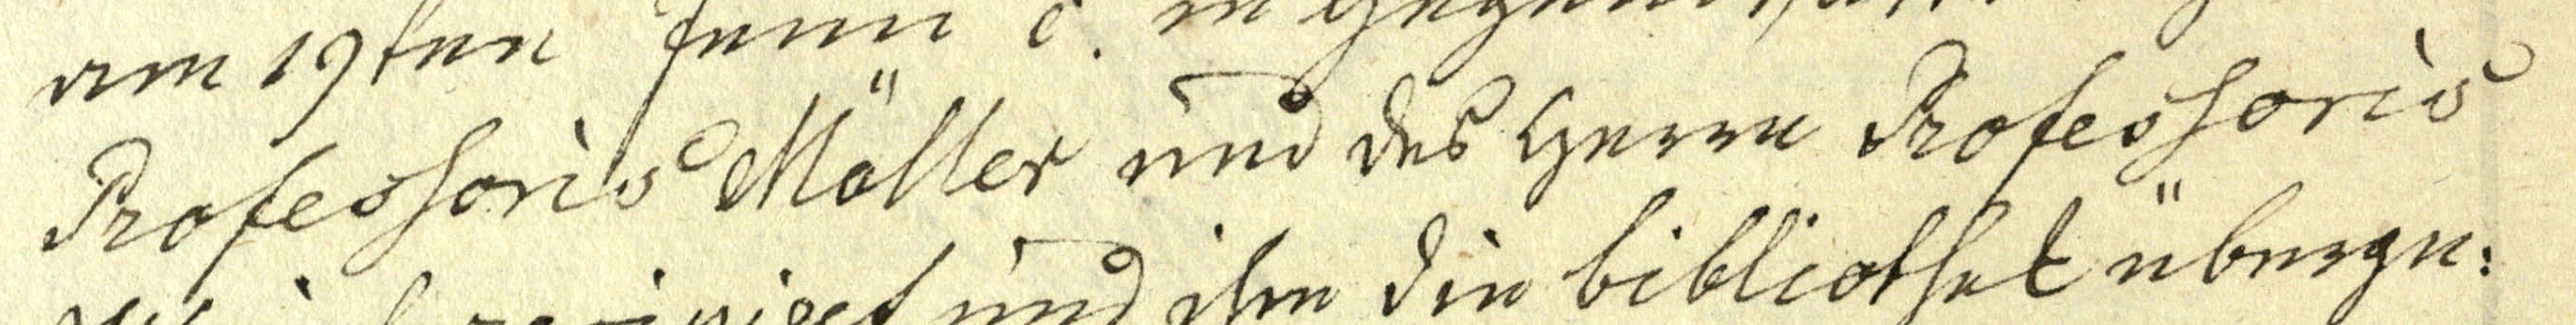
Professoris Möller und des Herrn Professoris
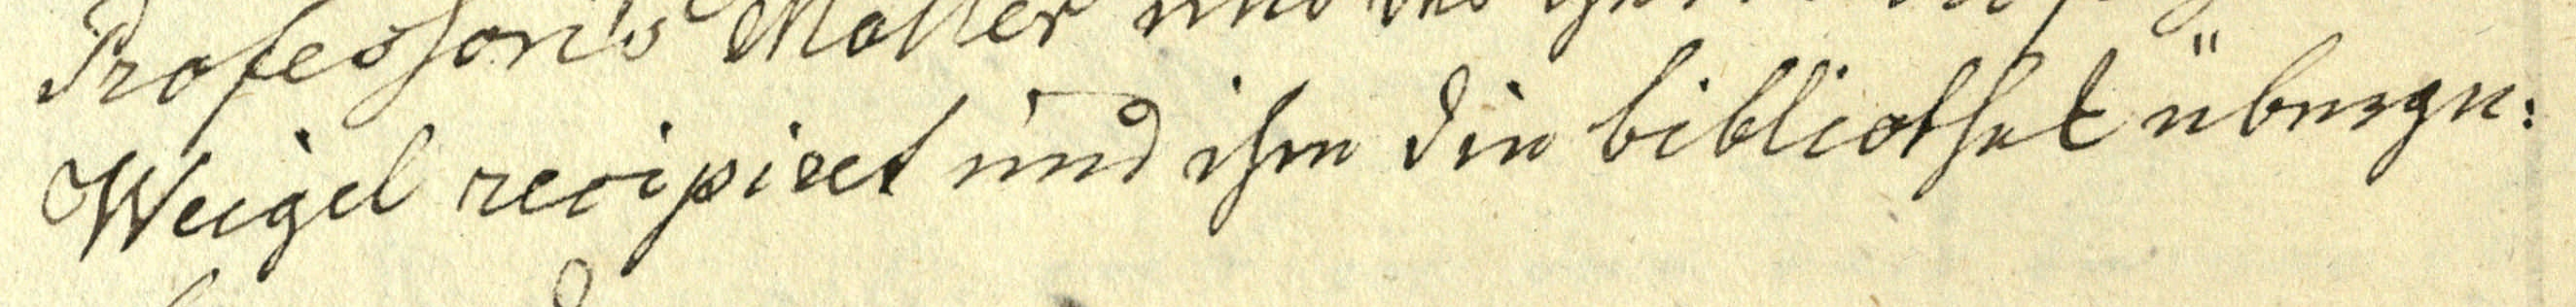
Weigel recipiret und ihm die Bibliothek überge¬
